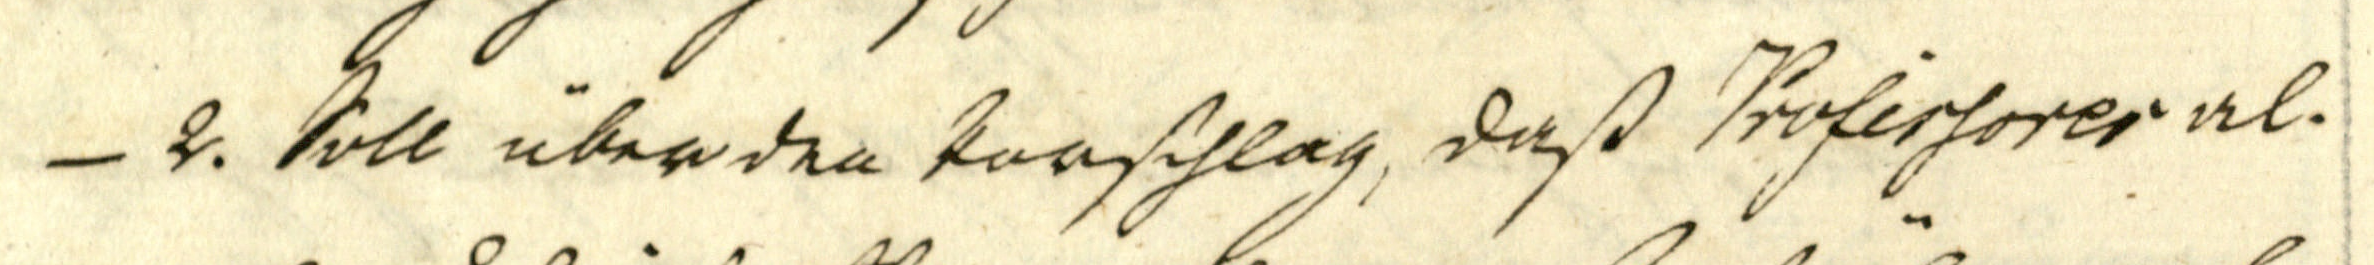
2. Soll über den Vorschlag, daß Professores al¬
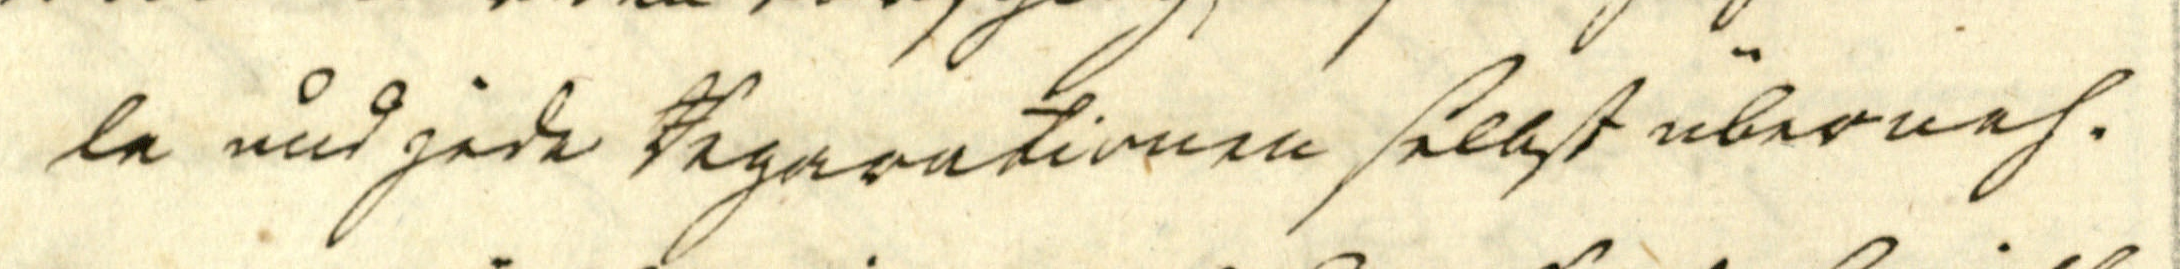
le und jede Reparationen selbst überneh¬
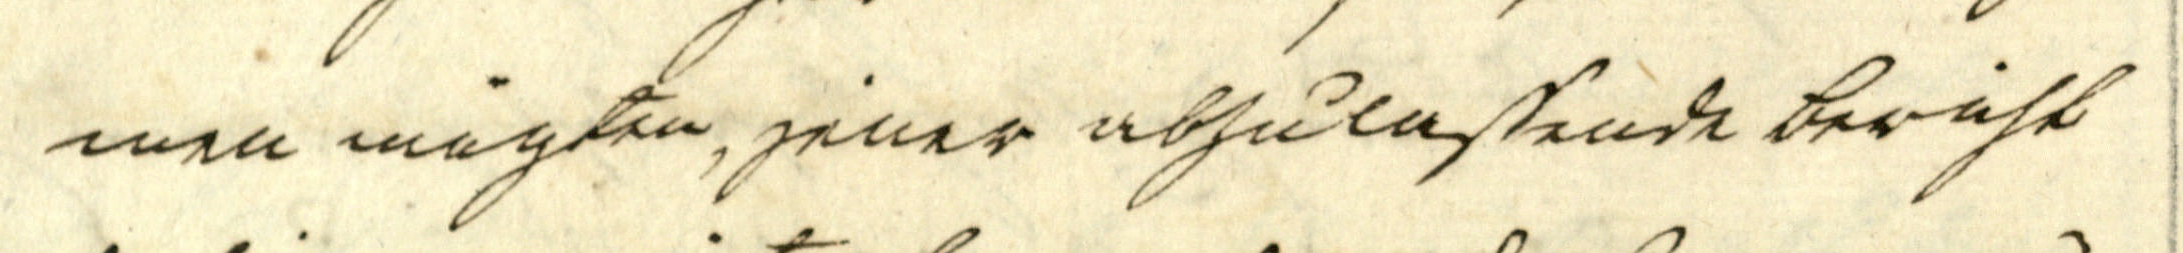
nen mögten, jener abzulassende Bericht
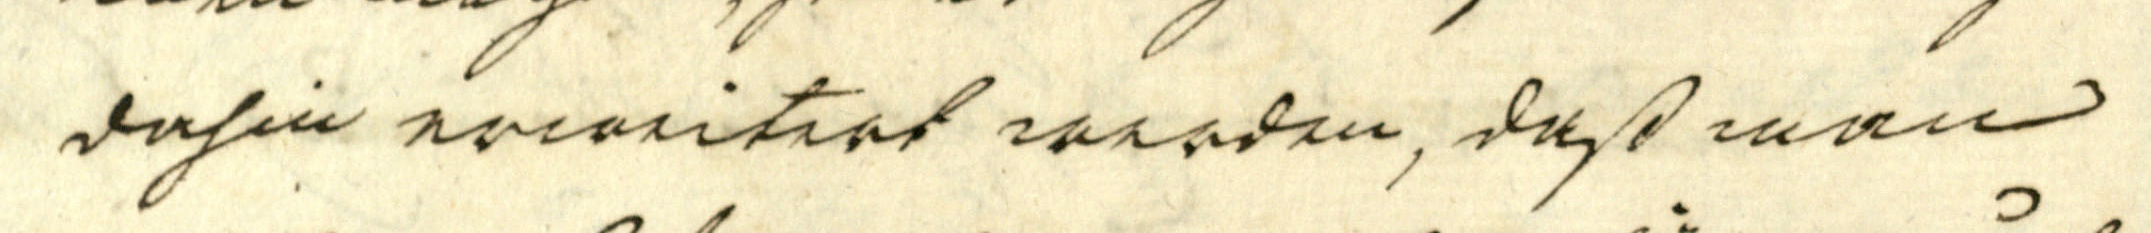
dahin erweitert werden, daß man
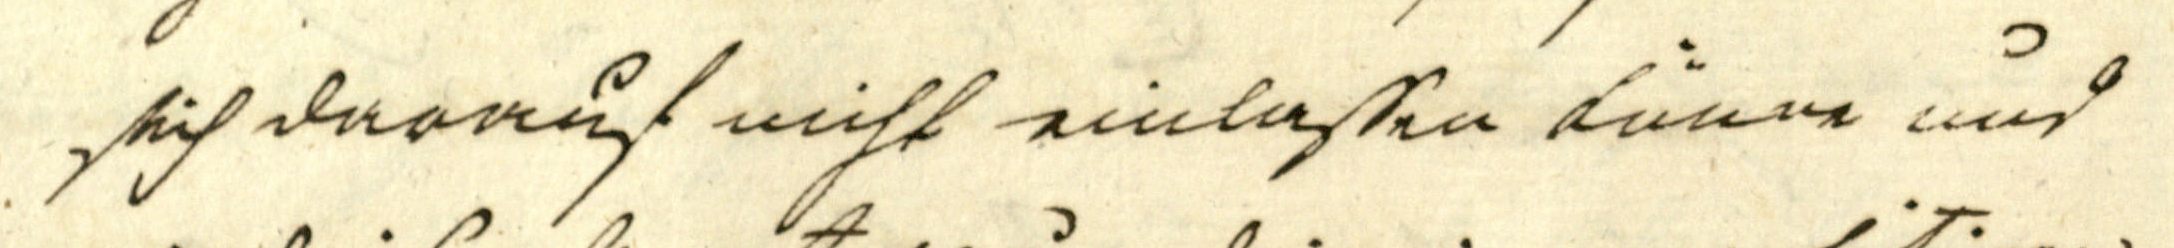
sich darauf nicht einlassen könne und
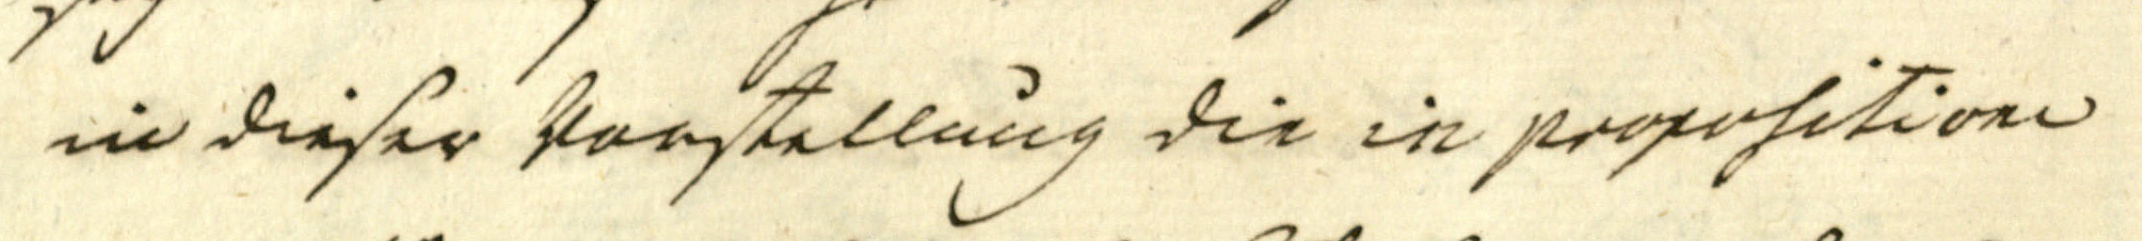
im dieser Vorstellung die in propositione
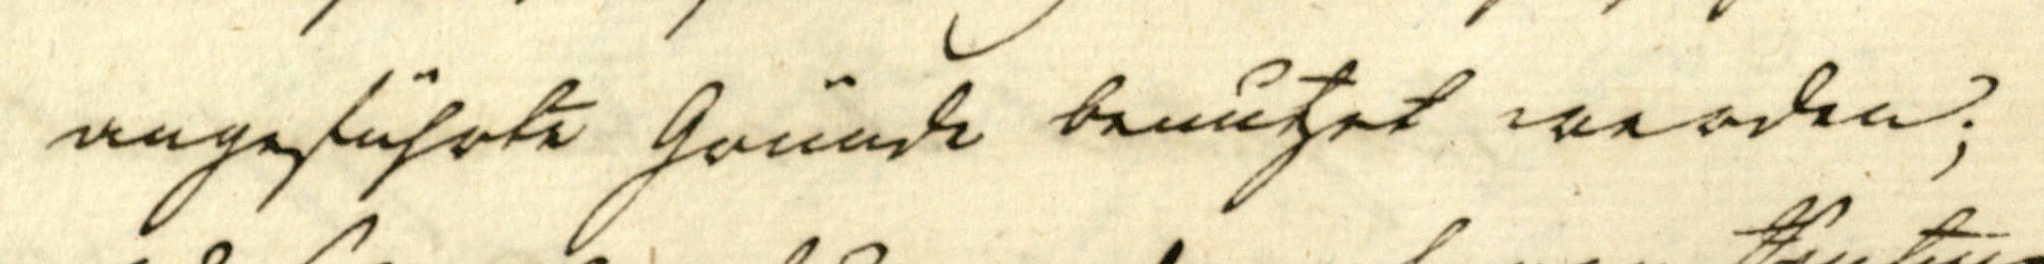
angeführte Gründe benutzet werden;
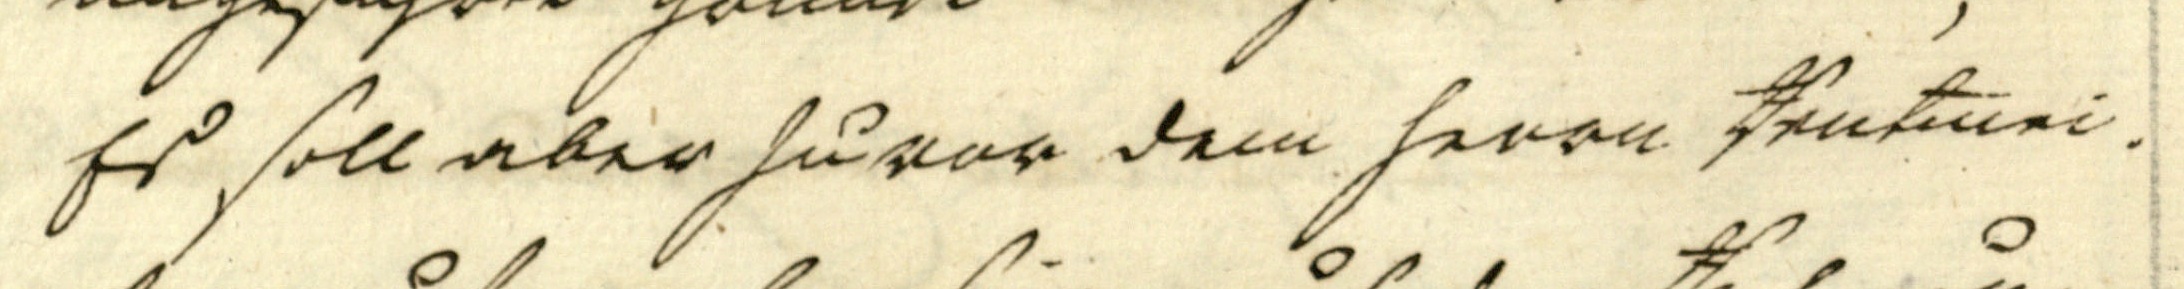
Es soll aber zuvor dem Herrn Rentmei¬
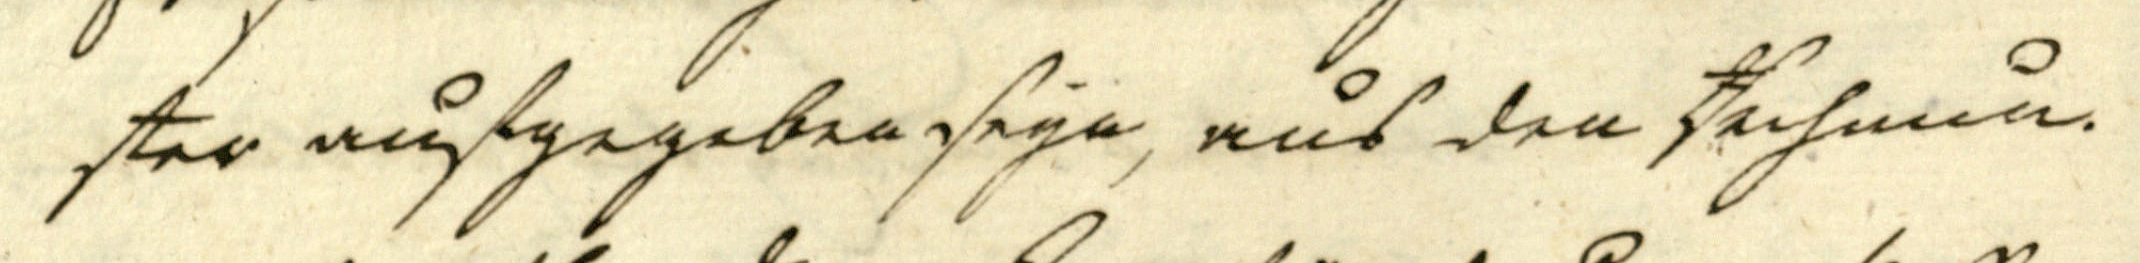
sten aufgegeben seÿn, aus den Rechnun¬
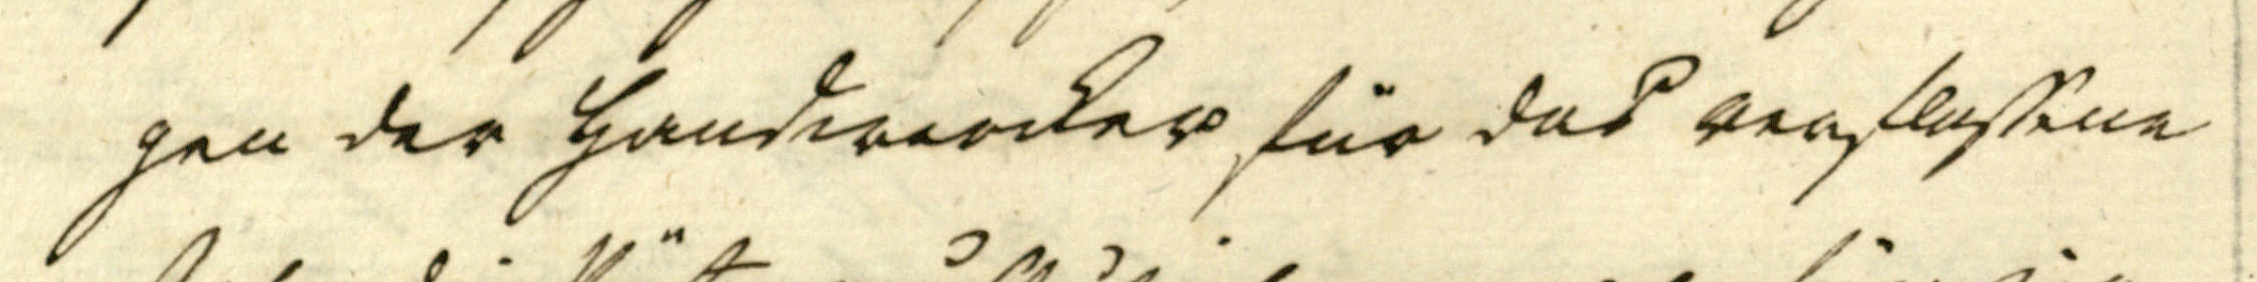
gen der Handwercker für das verflossene
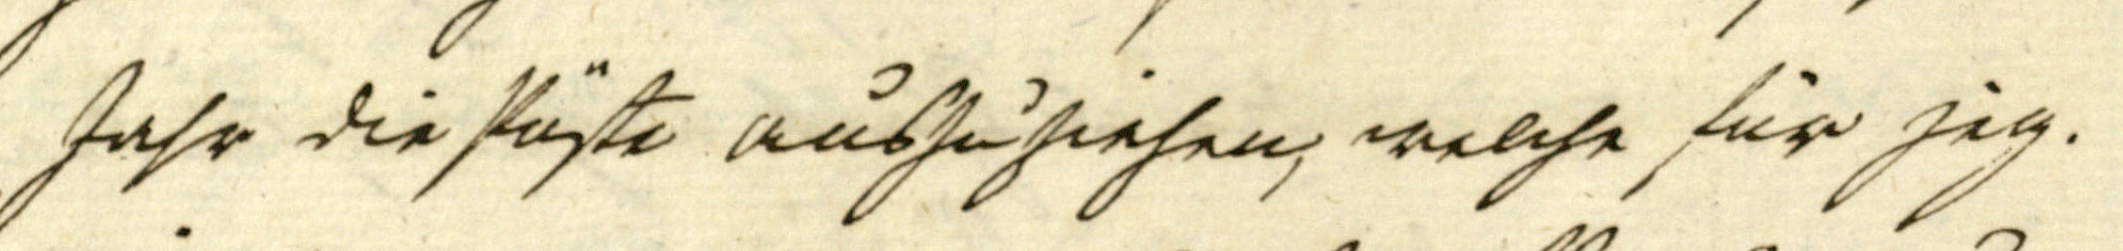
Jahr die Pöste auszuziehen, welche für jeg¬
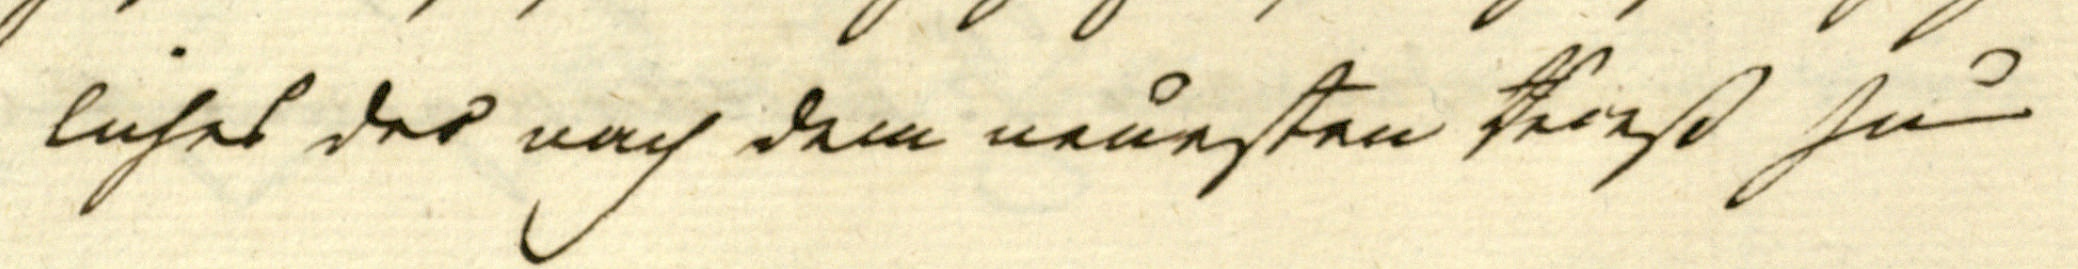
liches der nach dem neuesten Receß zu
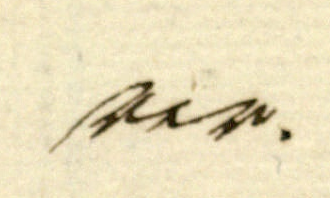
ver.
